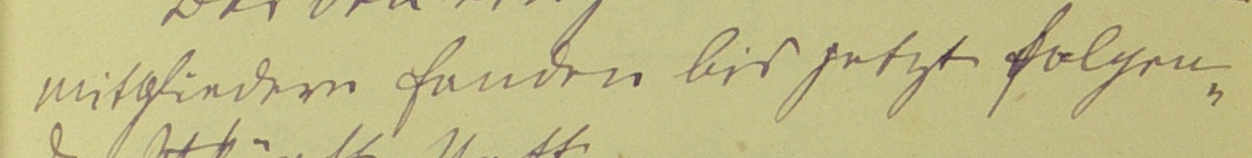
mitgliedern fanden bis jetzt folgen¬
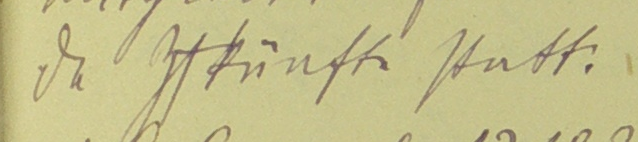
de Zusammenkünfte statt:
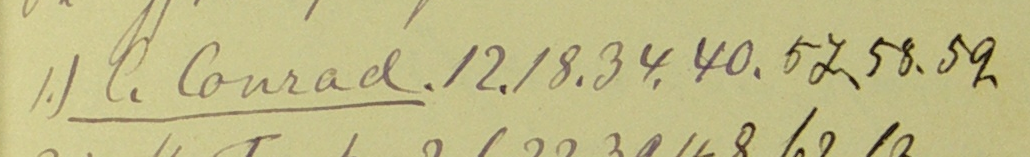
1.) C. Conrad 12.18.34.40.57.58.59.
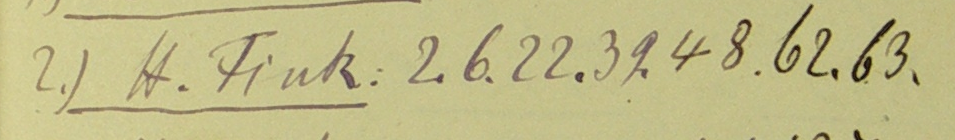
2.) H. Fink 1.6.22.39.48.62.63.
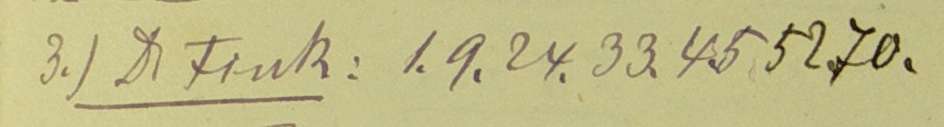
3.) Dr. Fink 1.9.24.33.45.52.70.
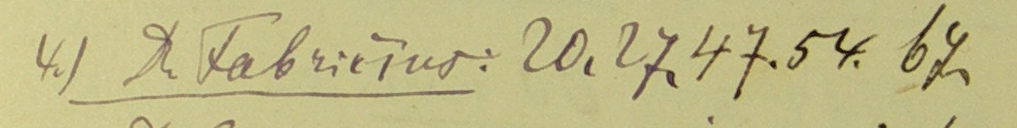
4.) Dr. Fabritius 20.27.47.54.64.
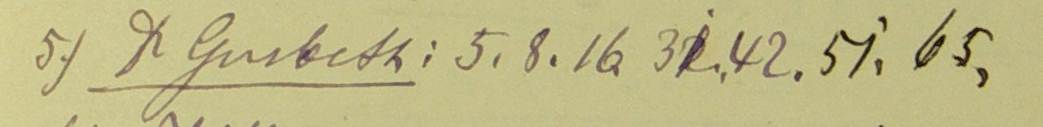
5.) Dr. Gusbeth 5.8.16.31.42.51.65.
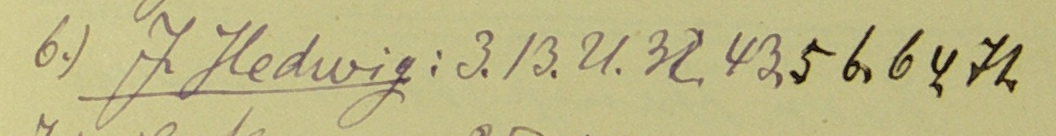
6.) J. Hedwig 3.13.21.32.43.56.64.71.
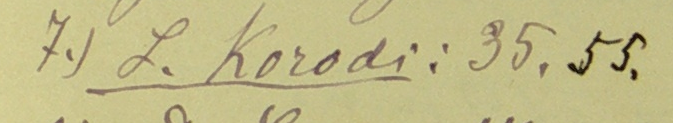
7.) L. Korodi 35.55.
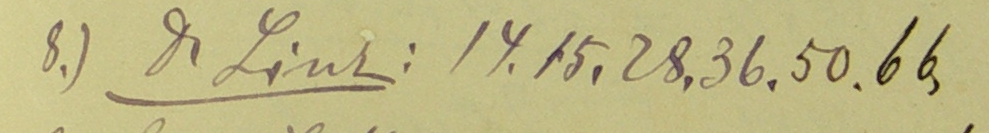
8.) Dr. Linz 14.15.28.36.50.66.
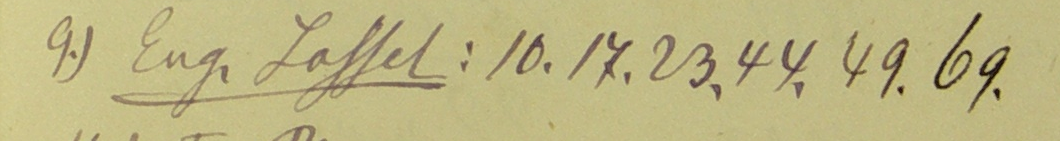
9.) Eug. Lassel 10.17.23.44.49.69.
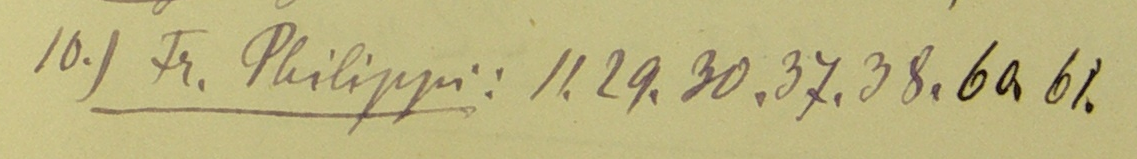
10.) Tr. Philippi 11.29.30.37.38.60.61.
